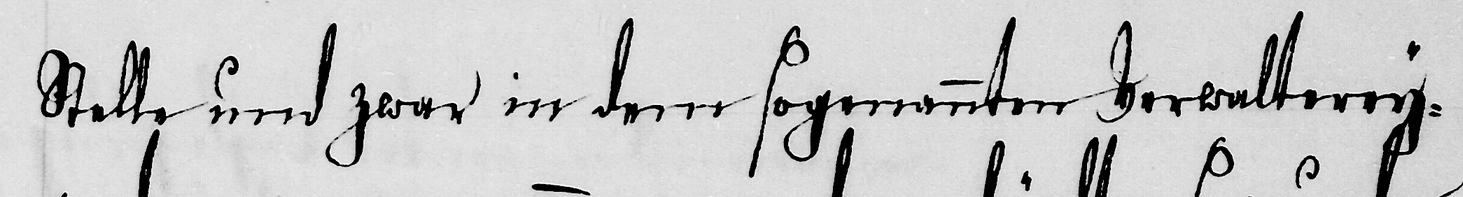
Stelle und zwar in dem sogenannten Verwalterey¬
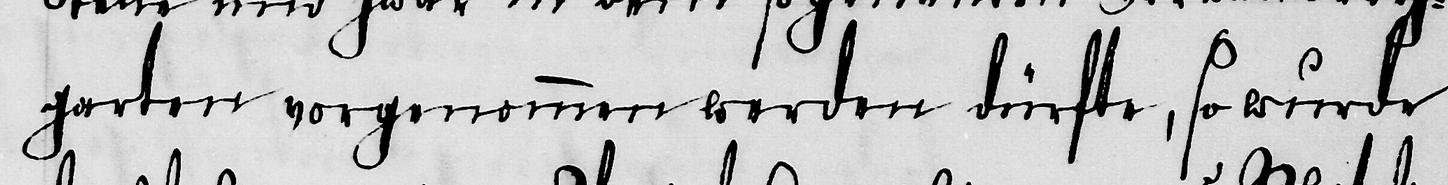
garten vorgenommen werden dürfte, so wurde
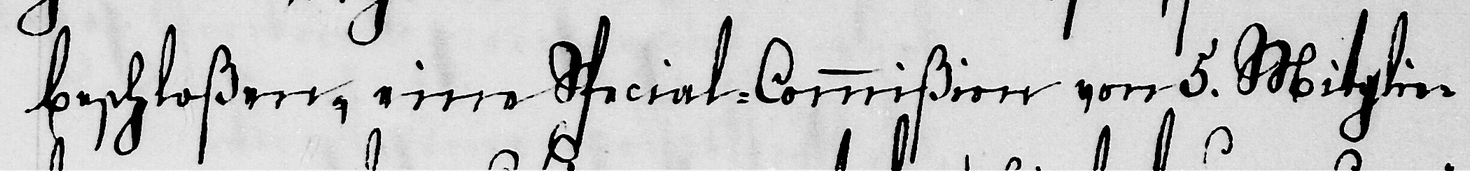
beschlossen, eine Special-Commißion von 5. Mitglie¬
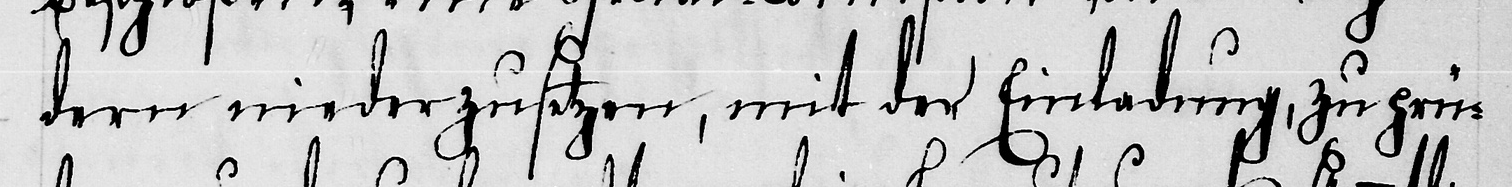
dern niederzusetzen, mit der Einladung, zu prü¬
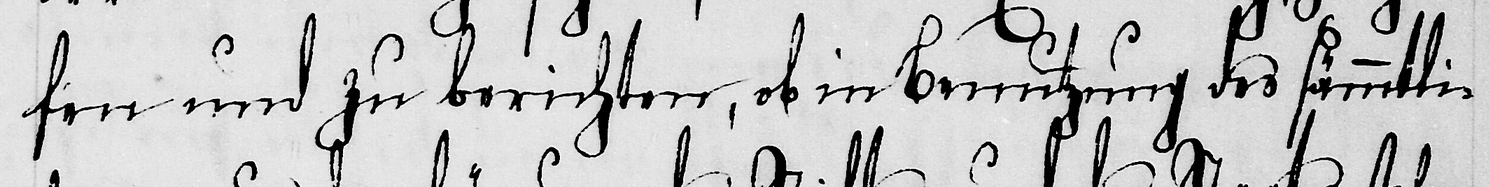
fen und zu berichten, ob in Benutzung des sämmtli¬
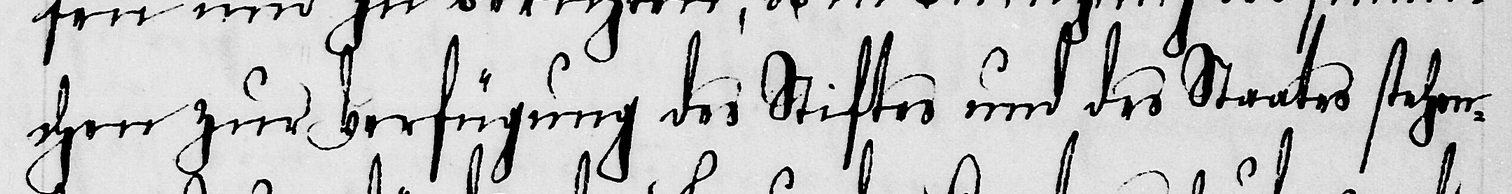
chen zur Verfügung des Stiftes und des Staates stehn¬
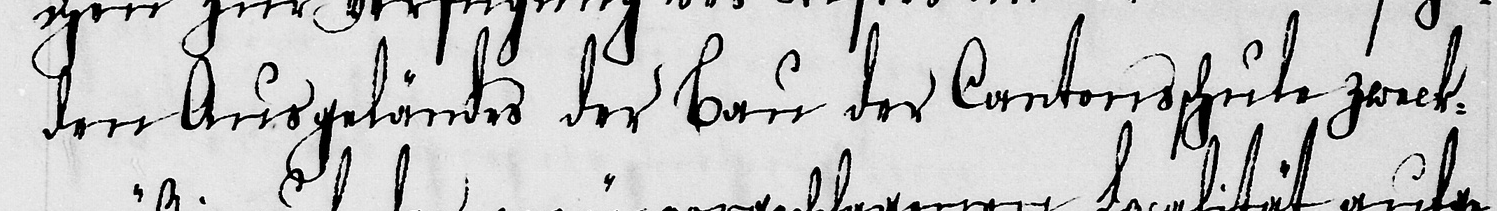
den Ausgeländes der Bau der Cantonsschule zweck¬
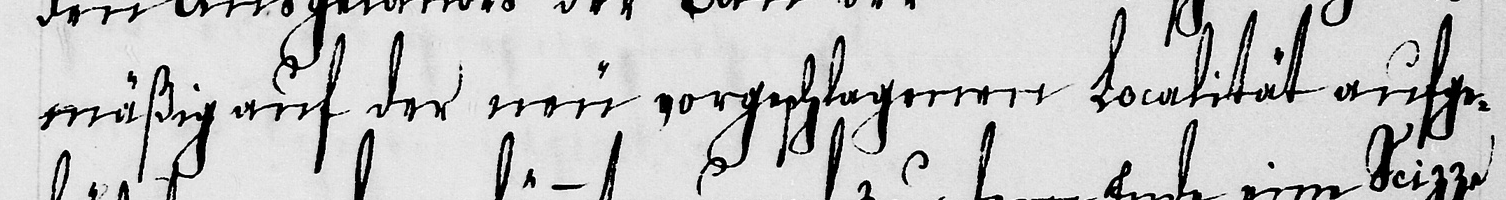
mäßig auf der neu vorgeschlagenen Localität aufge¬
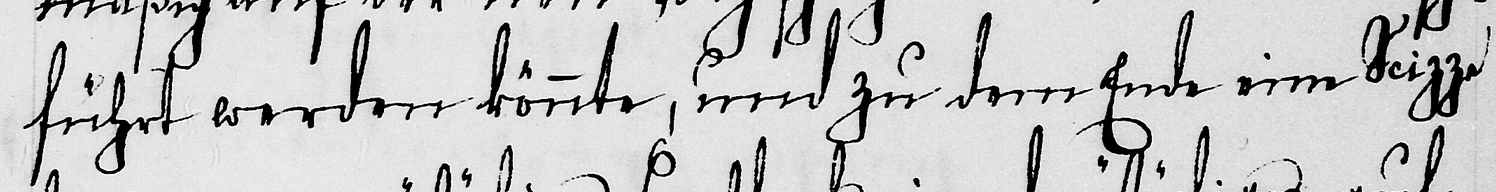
führt werden könnte, und zu dem Ende eine Scizze
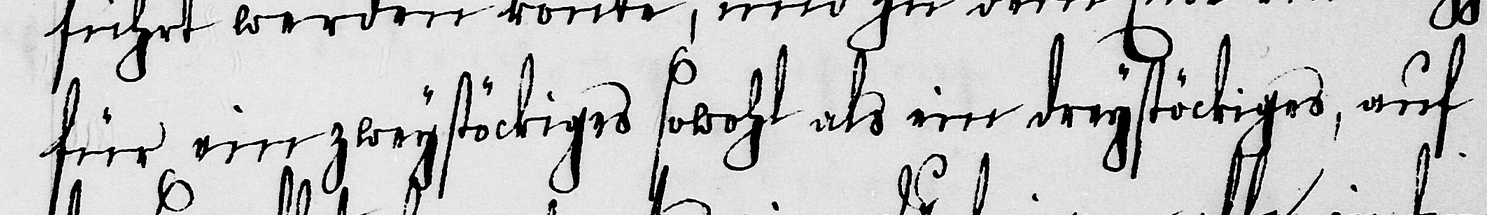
für ein zweystöckiges sowohl als ein dreystöckiges, auf
